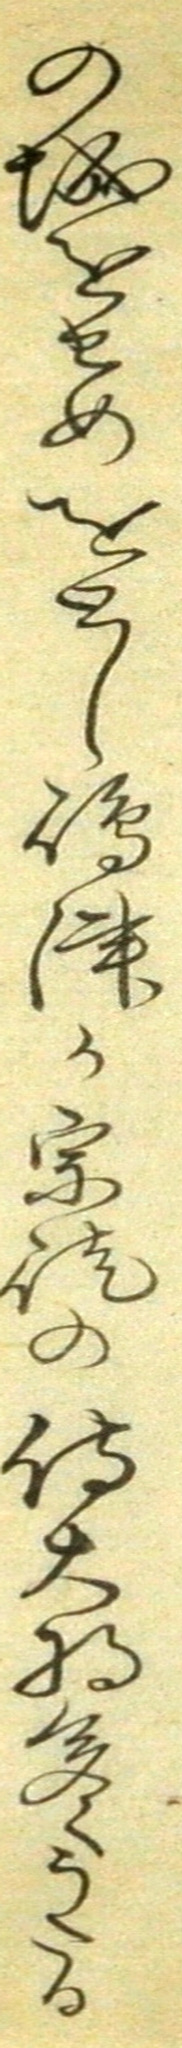の城をせめをとし島津か宗徒の侍大将多くうたる
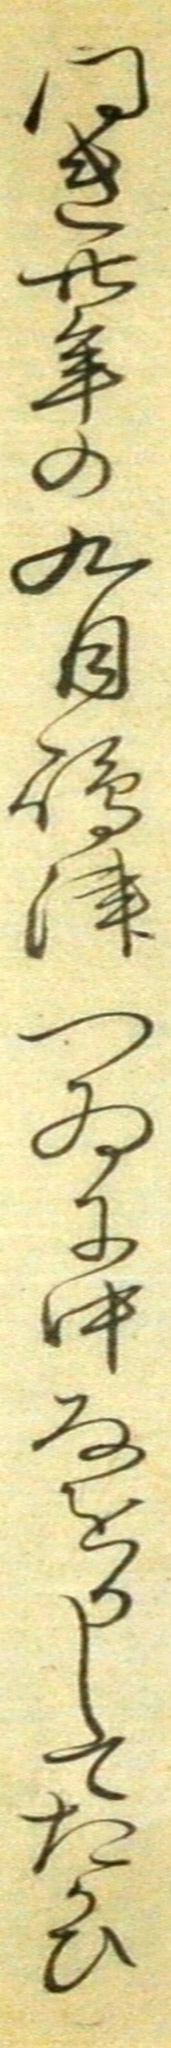同き廿年の九月島津つゐに中なをりしてたかひ
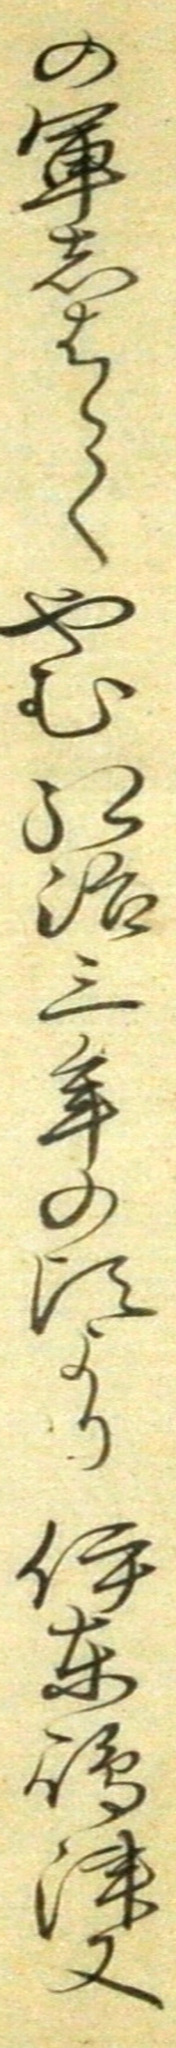の軍しはらくやむ弘治三年の頃より伊東島津又
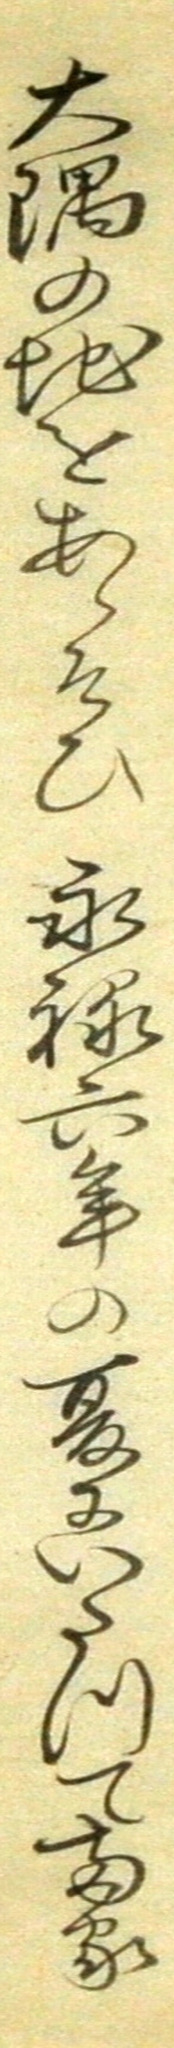大隅の地をあらそひ永禄六年の夏にいたつて両家
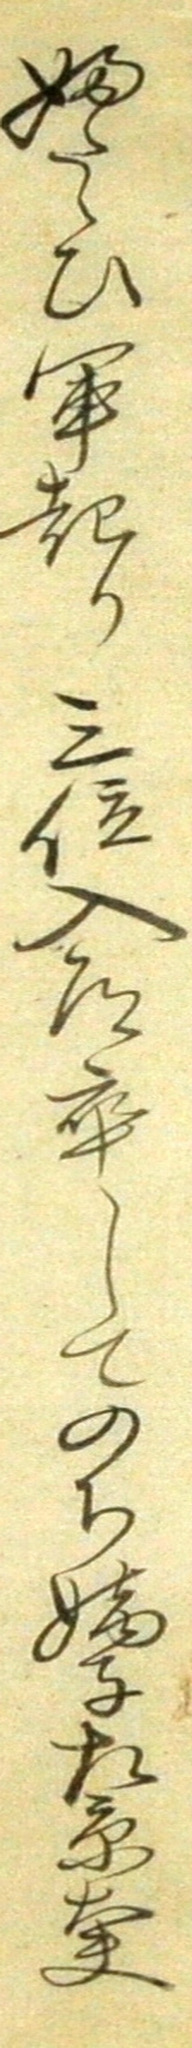ふたゝひ軍起り三位入道卒してのち嫡子左京大夫
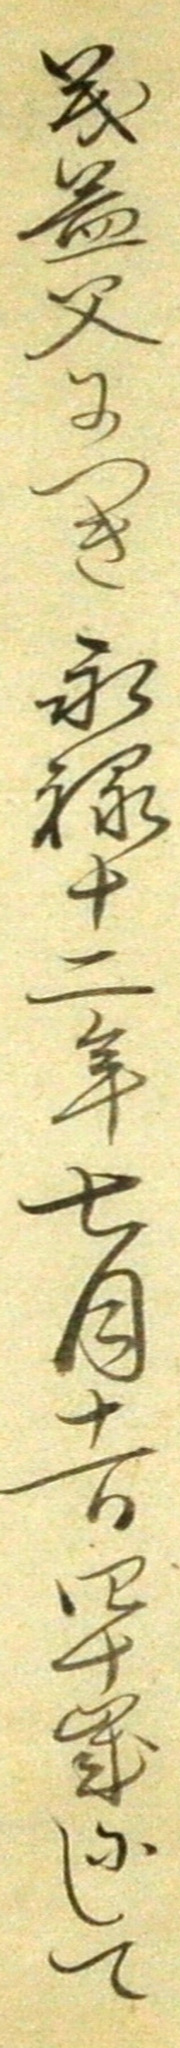義益父につき永禄十二年七月十一日四十歳にして
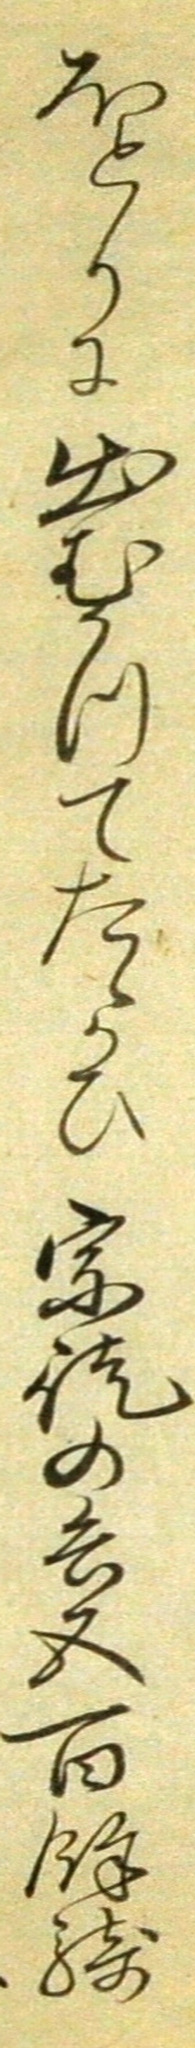ほとりに出むかつてたゝかひ宗徒の兵五百余騎
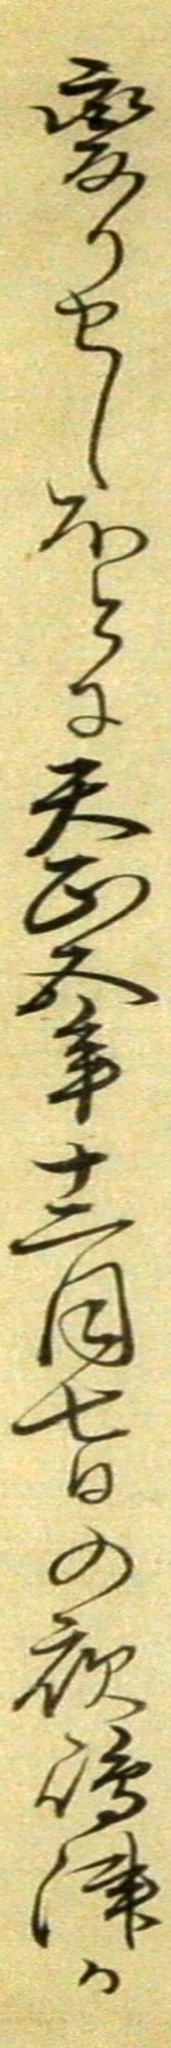変りせしほとに天正五年十二月七日の夜島津か
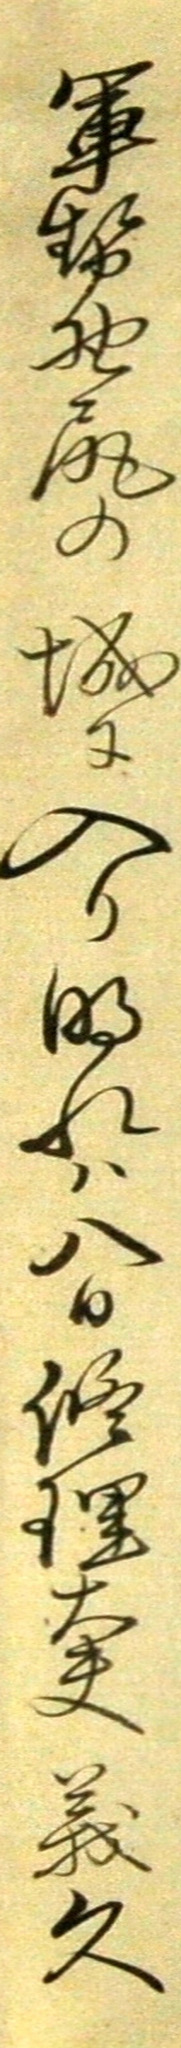軍勢野尻の城に入り明れは八日修理大夫義久

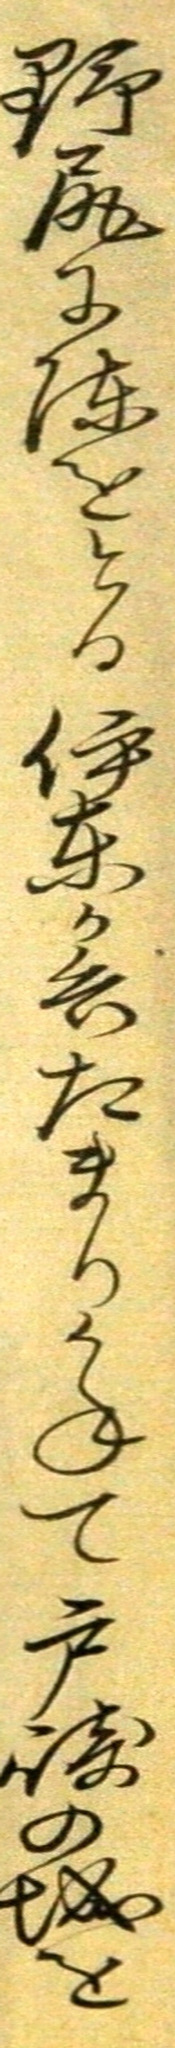野尻に陣をとる伊東か兵たまりかねて戸崎の城を
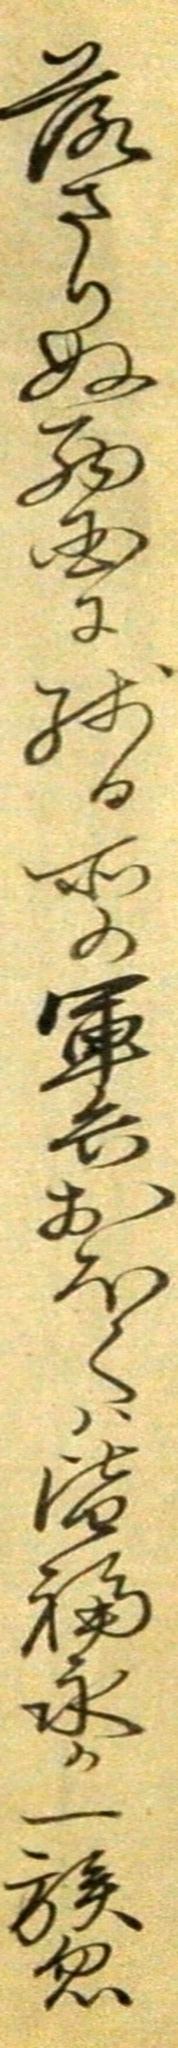落さりぬ西国に残る所の軍兵おほくは皆福永か一族忽
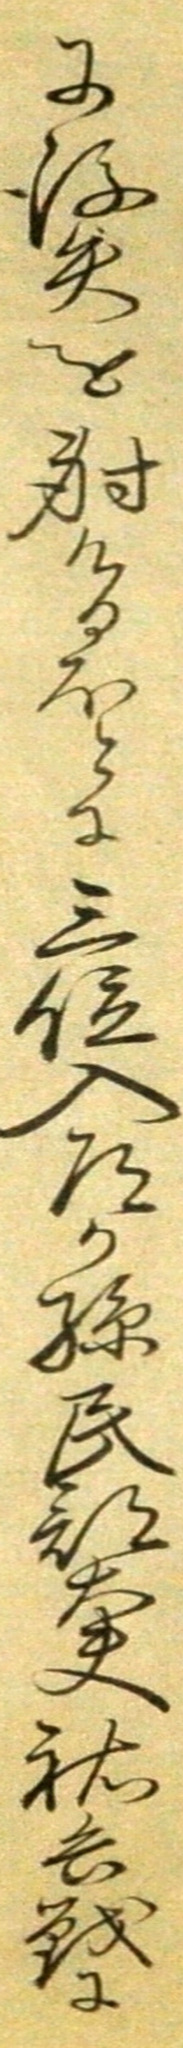に後矢を射けるほとに三位入道か孫民部大夫祐兵戦に
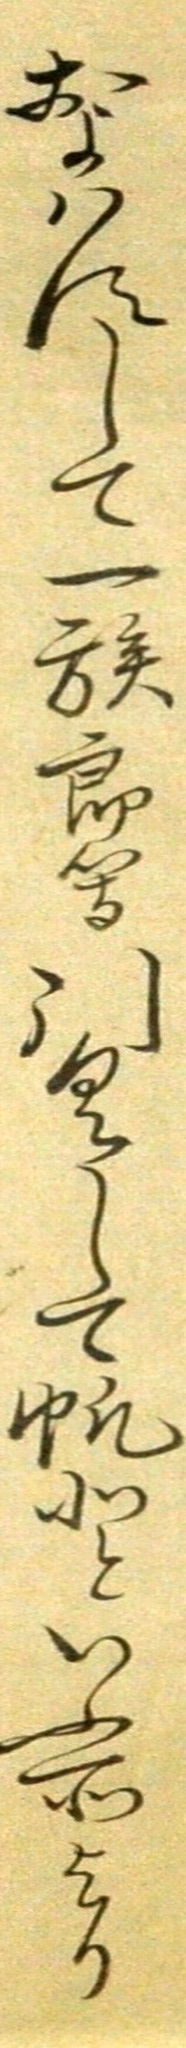およはすして一族郎等引具して帆北といふ所より
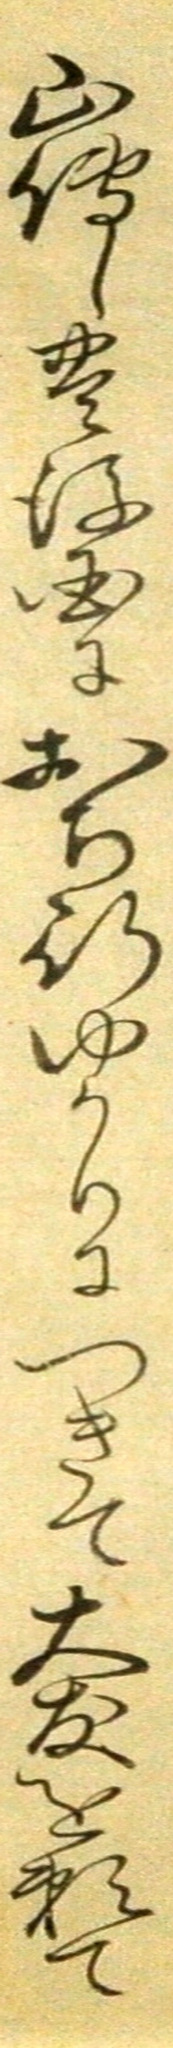山伝し豊後国におち行ゆかりにつきて大友を頼て
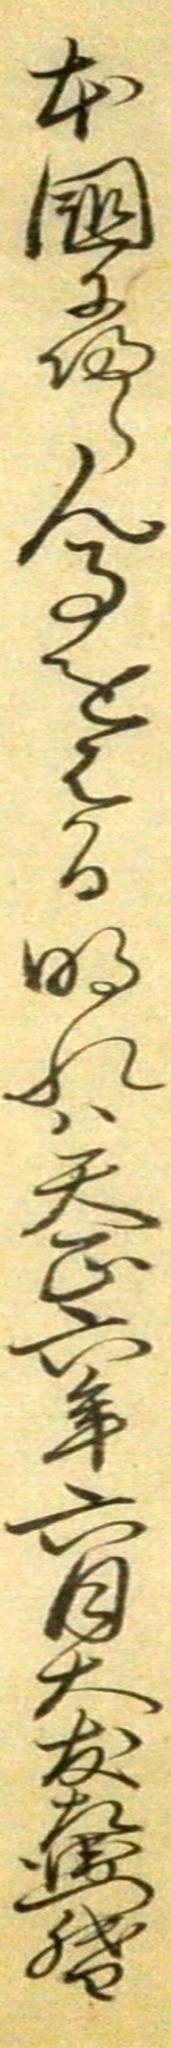本国に帰らん事をはかる明れは天正六年六月大友左衛門督
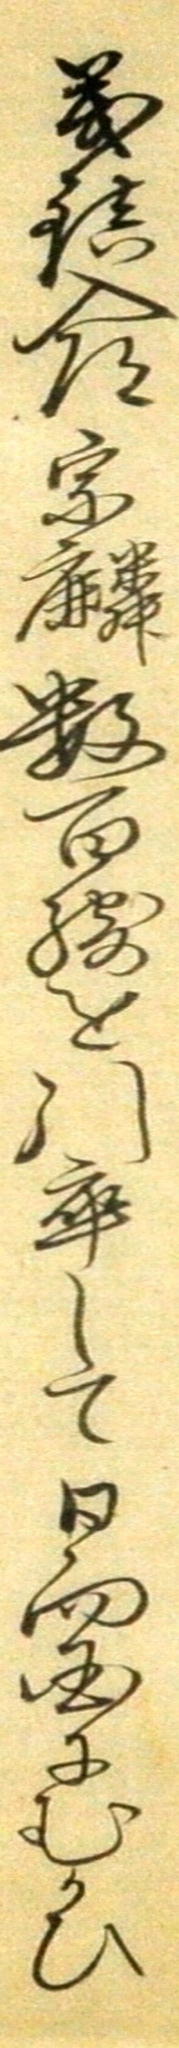義鎮入道宗麟数百騎を引率して日向国にむかひ
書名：藩翰譜（九・下）
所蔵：伊那市立高遠町図書館・合同会社AMANE
